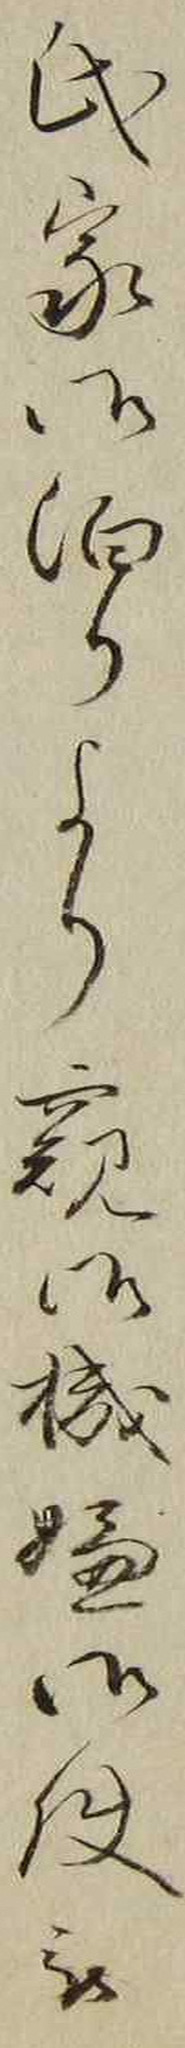氏家御泊りより窺御機嫌御使被
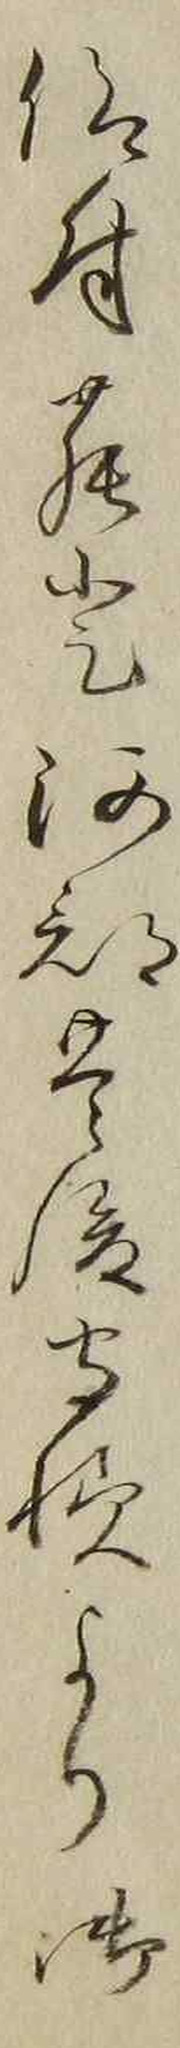仰付罷登阿部豊後守様より御

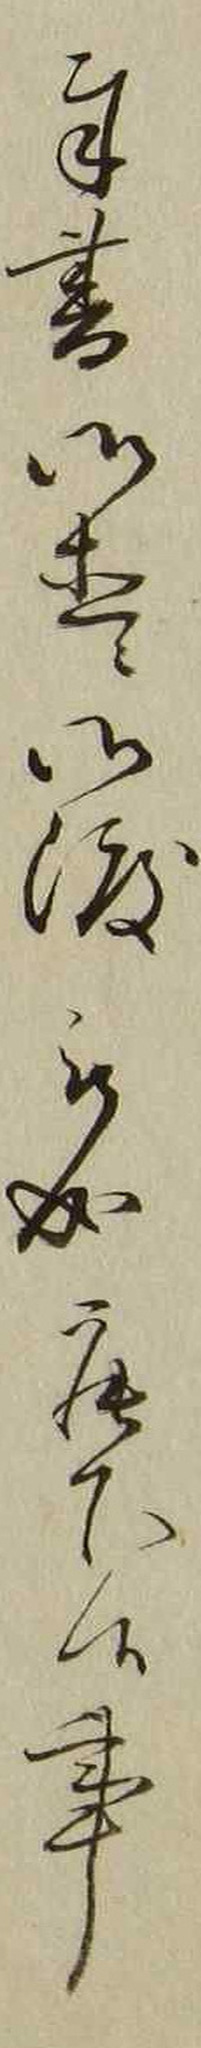奉書御直ニ御渡被成罷下候事
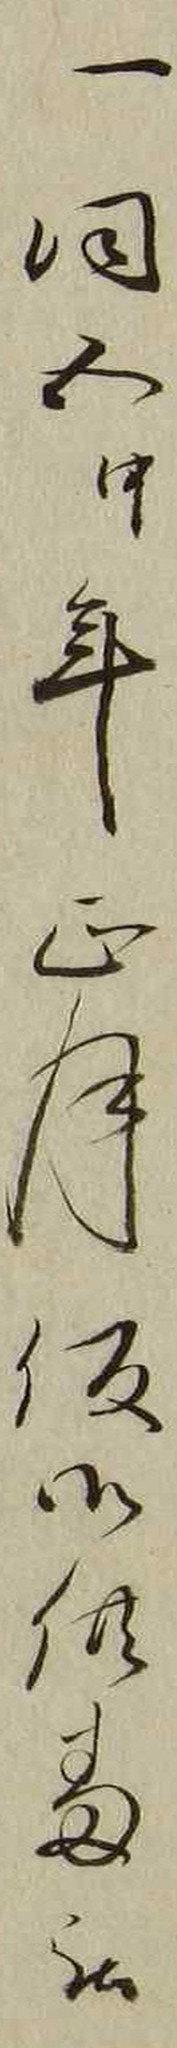一同五申年正月仮御供番被
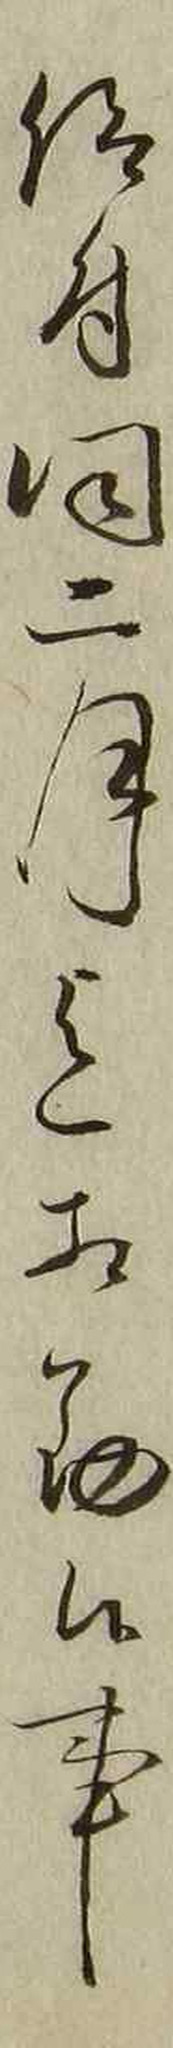仰付同二月迄相勤候事
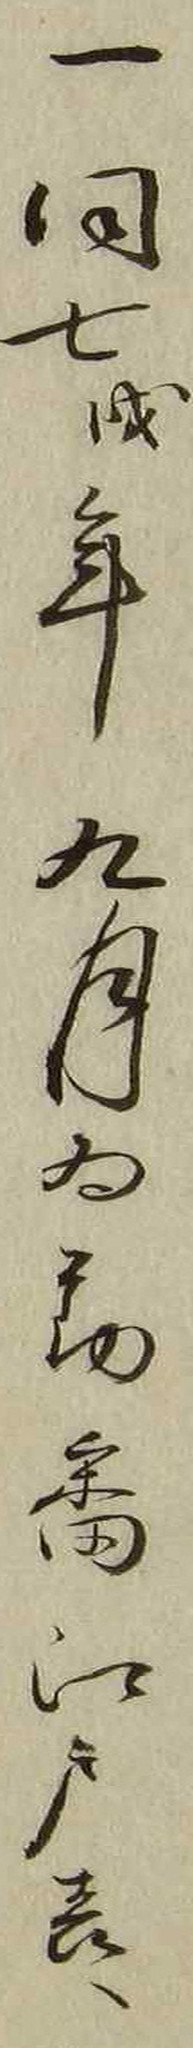一同七戌年九月為勤番江戸表へ
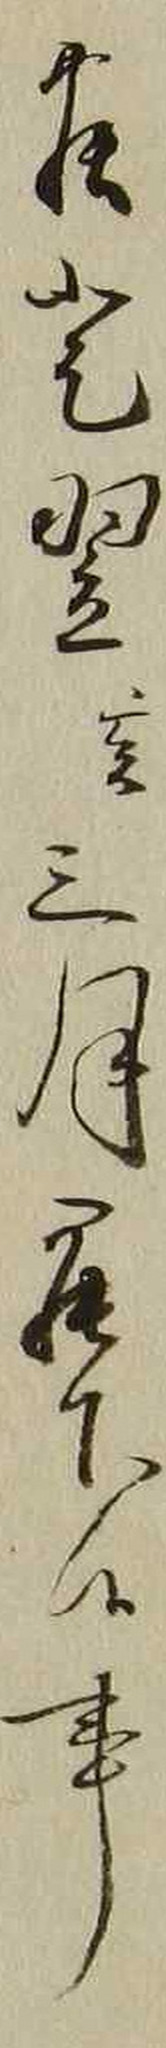罷登翌亥三月罷下候事
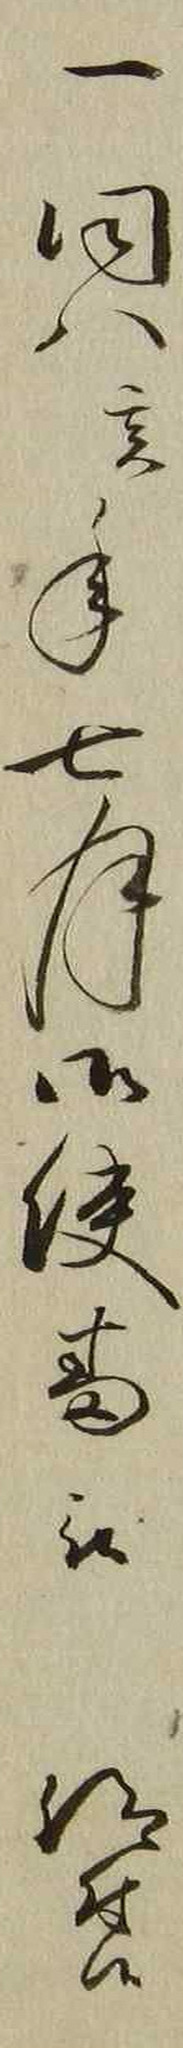一同八亥年七月御使番被仰付候
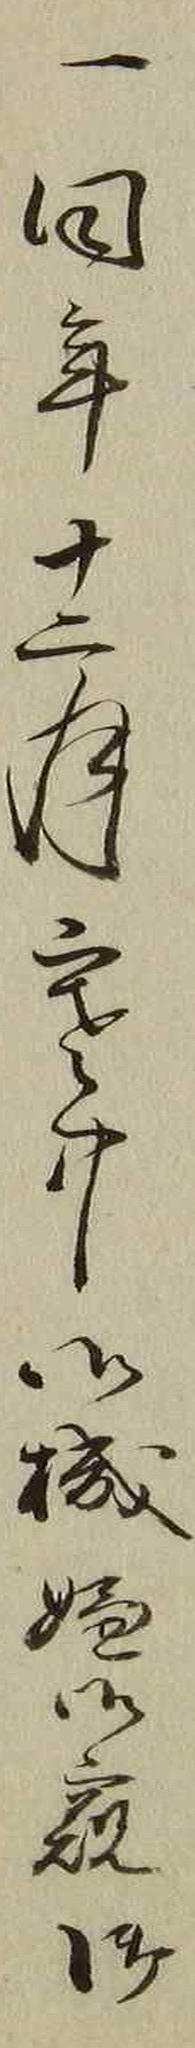一同年十二月寒中御機嫌御窺御
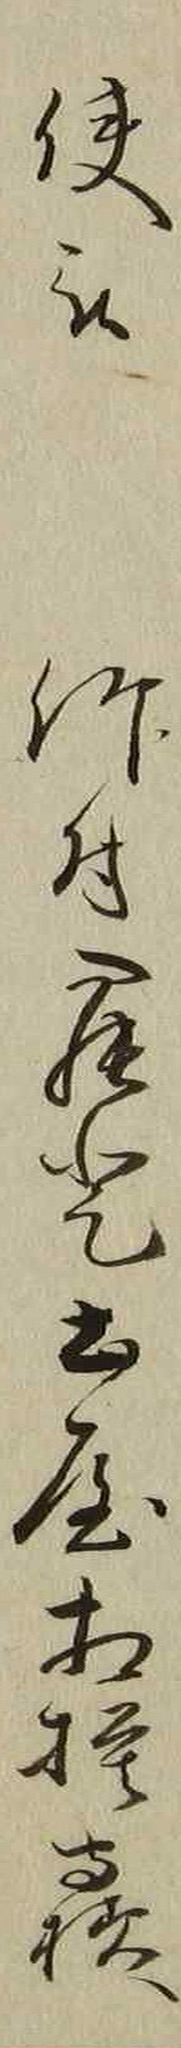使被仰付罷登土屋相模守様へ
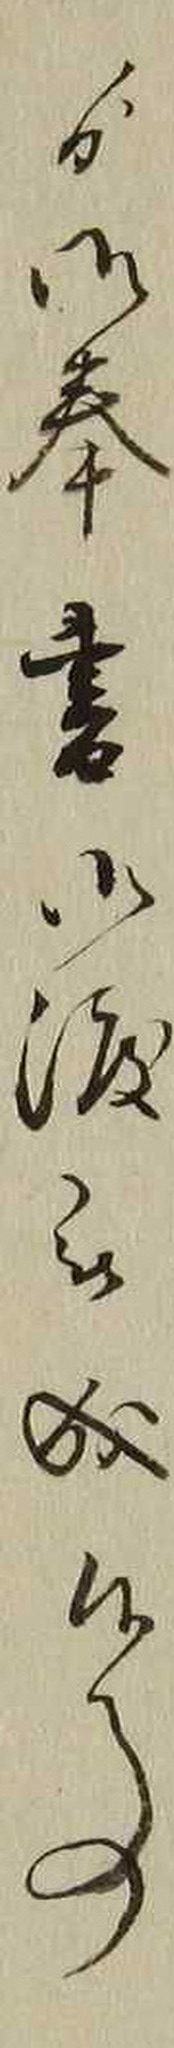ゟ御奉書御渡被成候事
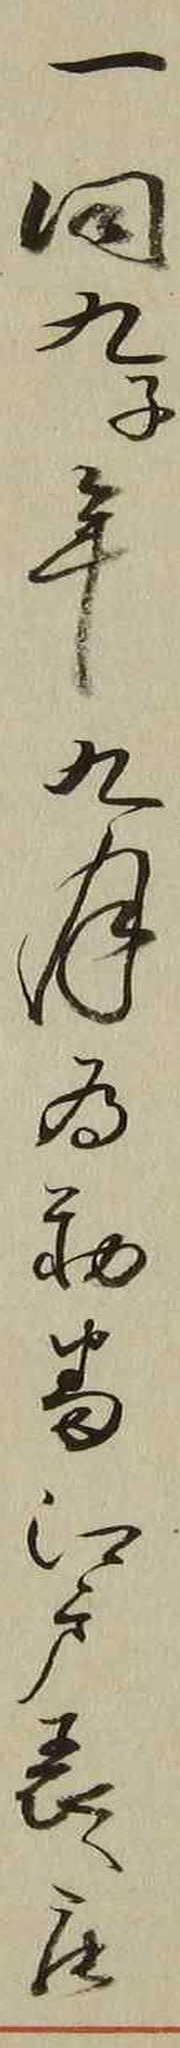一同九子年九月為勤番江戸表へ罷
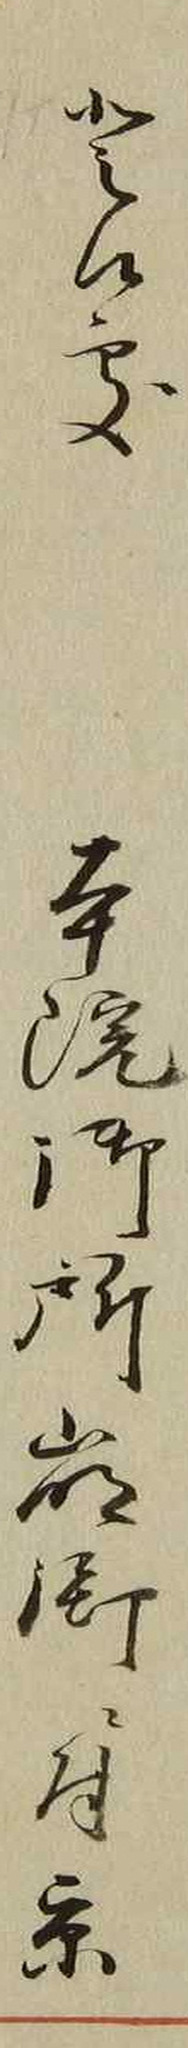登候処本院御所崩御ニ付京
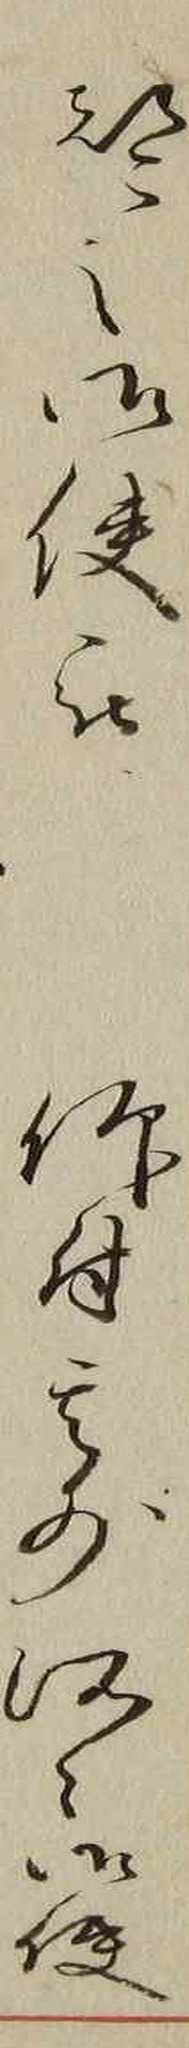都へ之御使被仰付其外所々御使
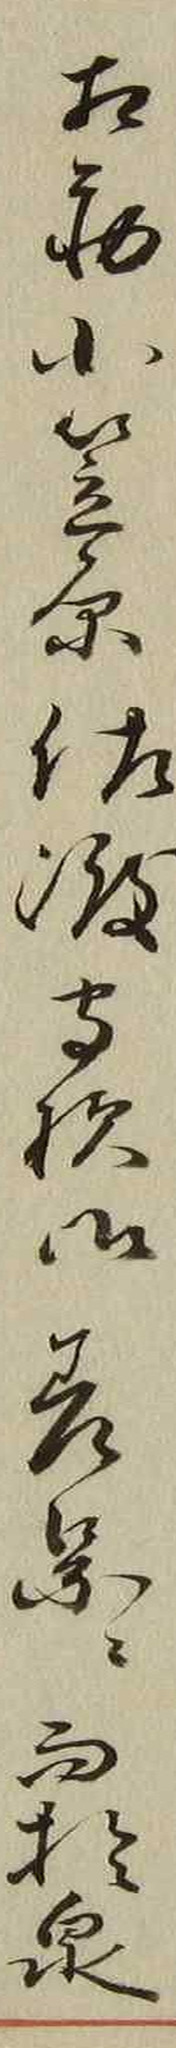相勤小笠原佐渡守様御差図ニ而於泉
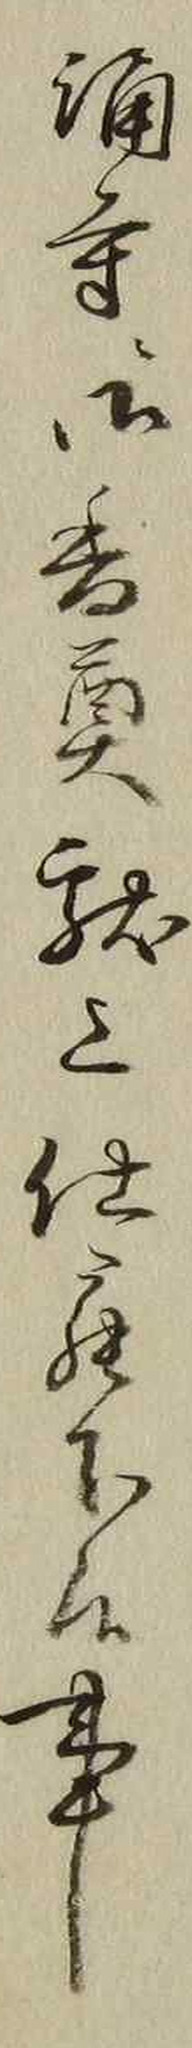涌寺ニ御香奠献上仕罷下候事
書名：諸士系譜　巻之2　い之部2
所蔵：会津若松市立会津図書館
